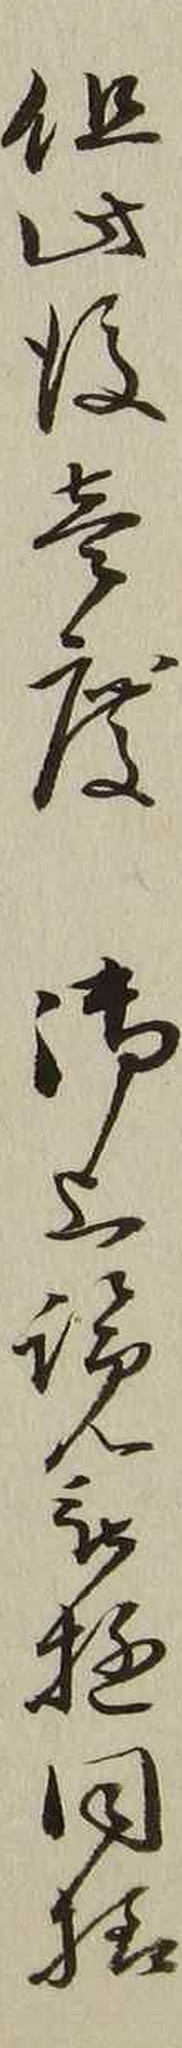但此後壱度御上覧被遊同様
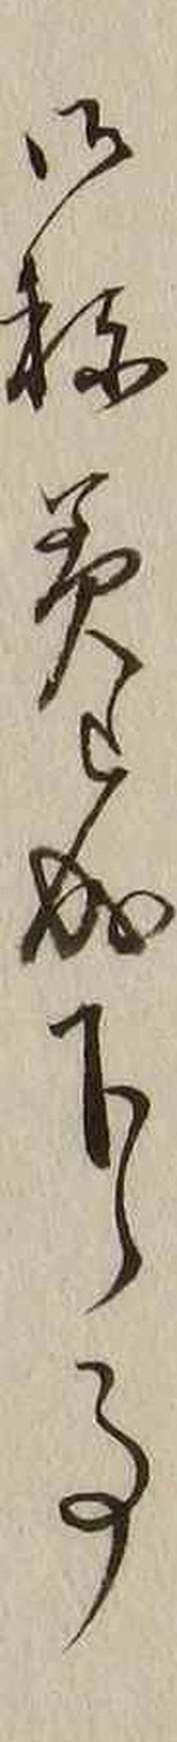御称美被成下候事
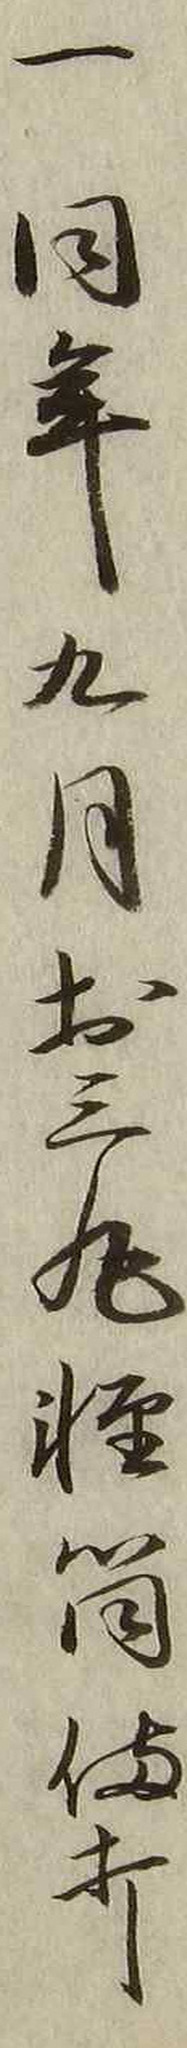一同年九月於三丸軽筒備打
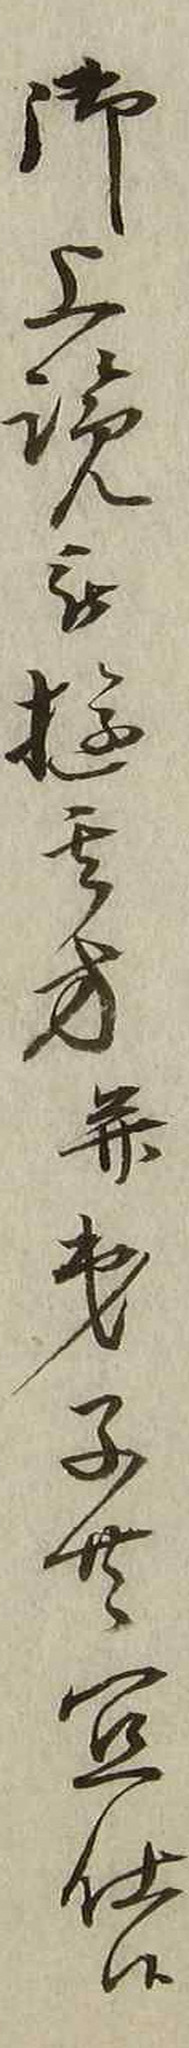御上覧被遊其方并弟子共宜仕候
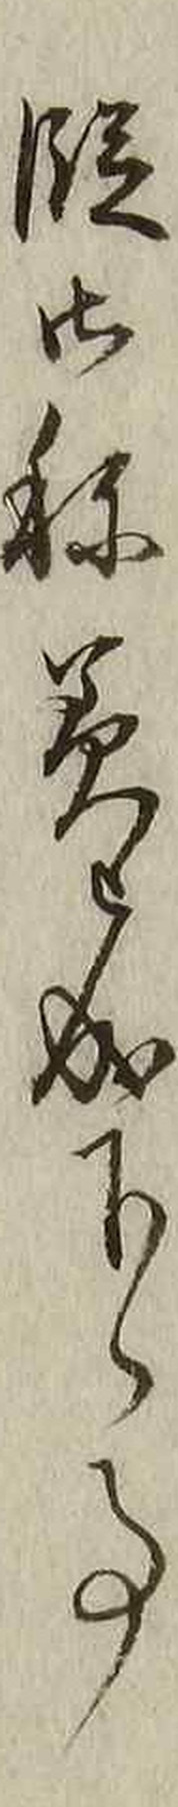段御称美被成下候事
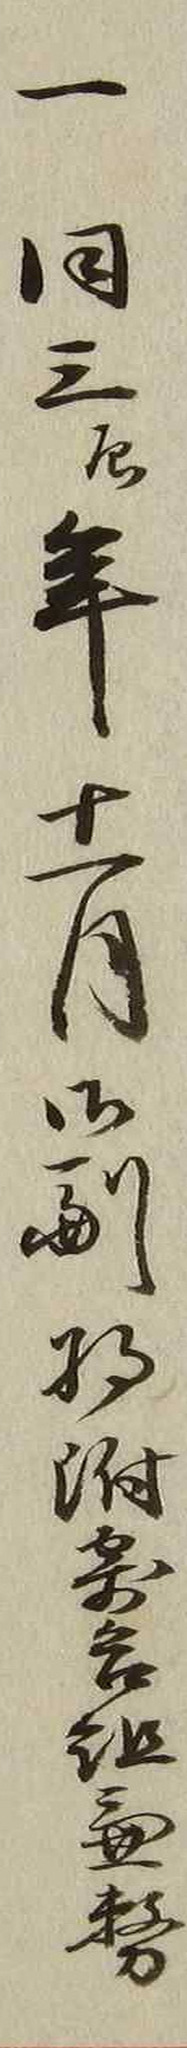一同三辰年十一月御副将附寄合組兼務
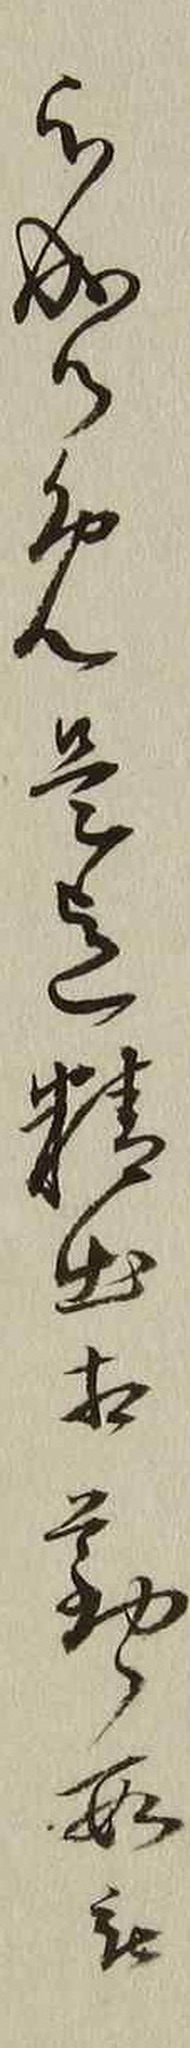被成御免是迄精出相勤候段被
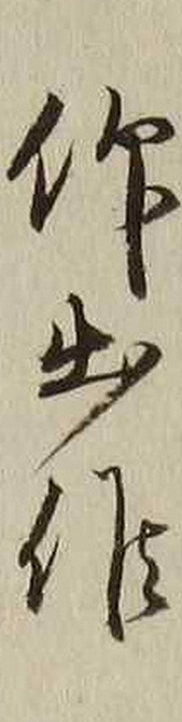仰出候
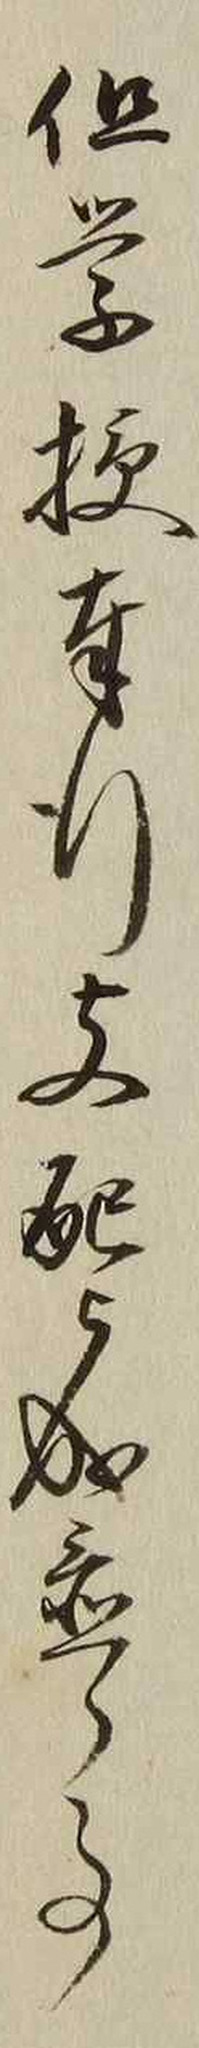但学校奉行支配被成置候事
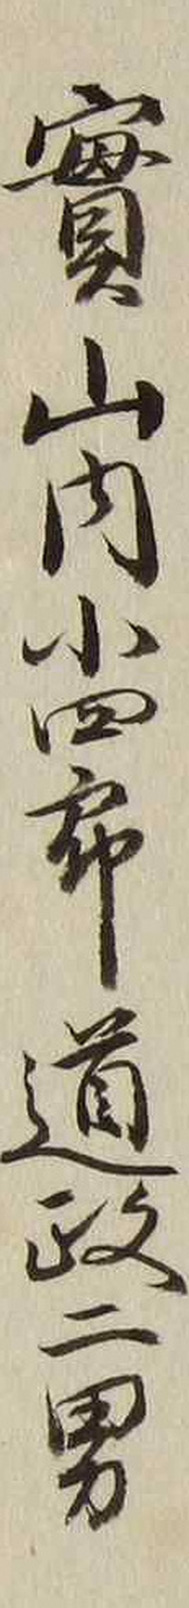実山内小四郎道政二男
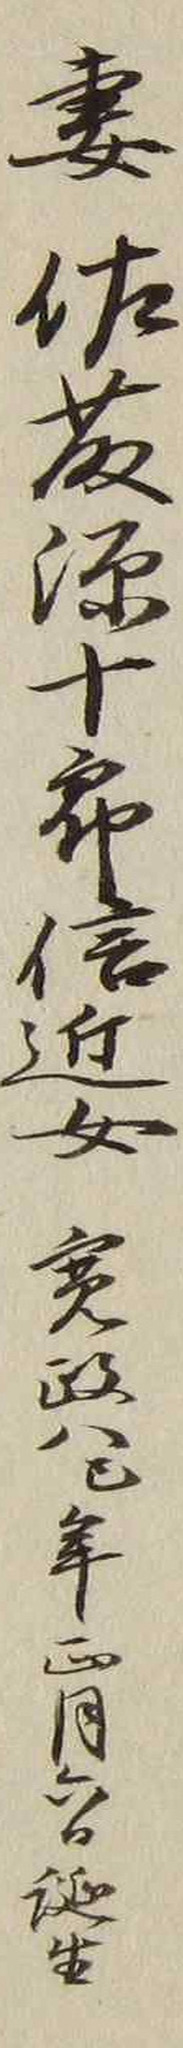妻佐藤源十郎信近女寛政八巳年正月六日誕生

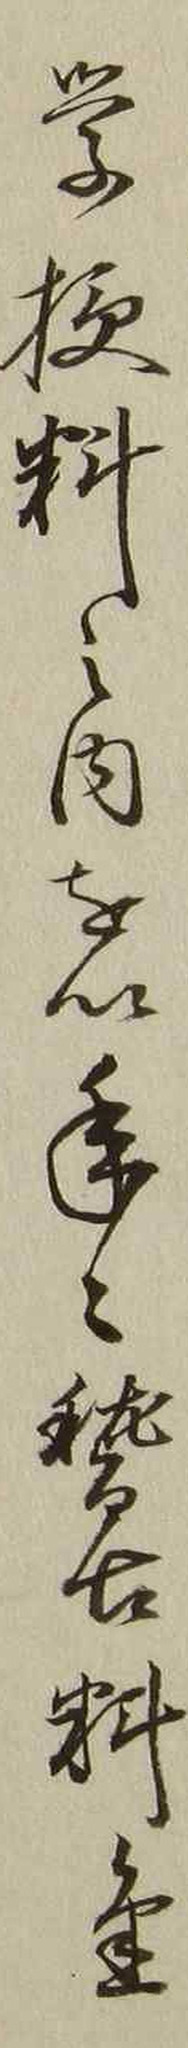学校料之内を以年々稽古料金
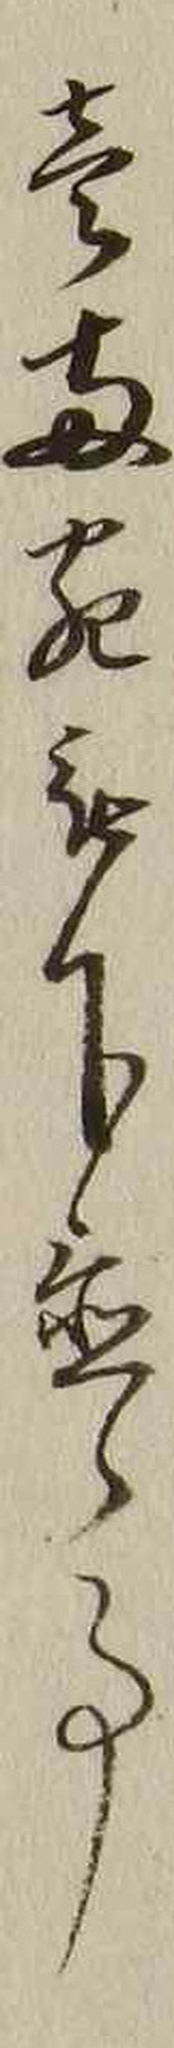壱両宛被下置候事
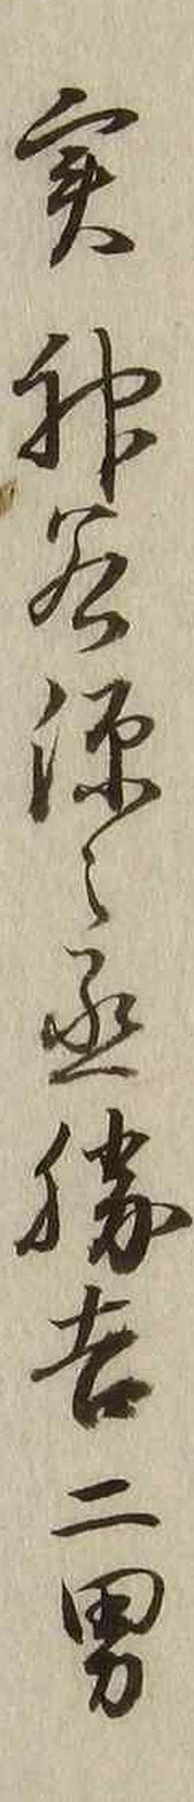実神谷源之丞勝吉二男

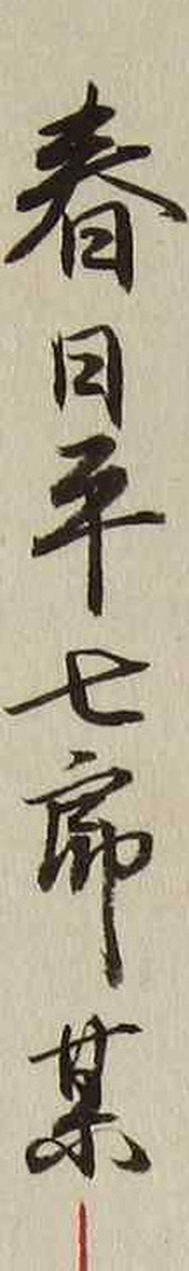春日平七郎某
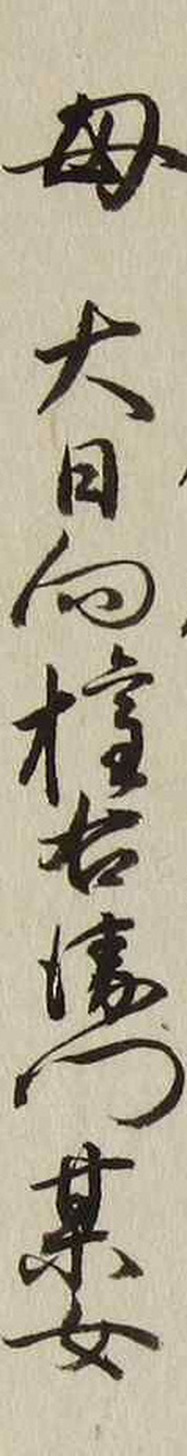母大日向権右衛門某女
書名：諸士系譜　巻之102　か之部10
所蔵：会津若松市立会津図書館
